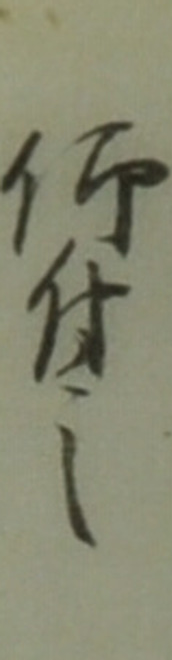仰付之

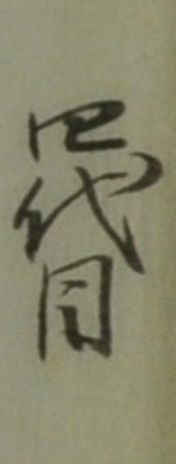四代目
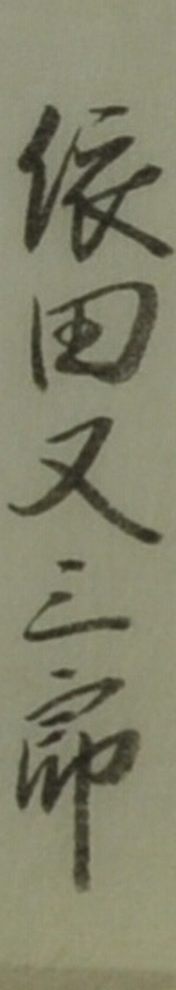依田又三郎
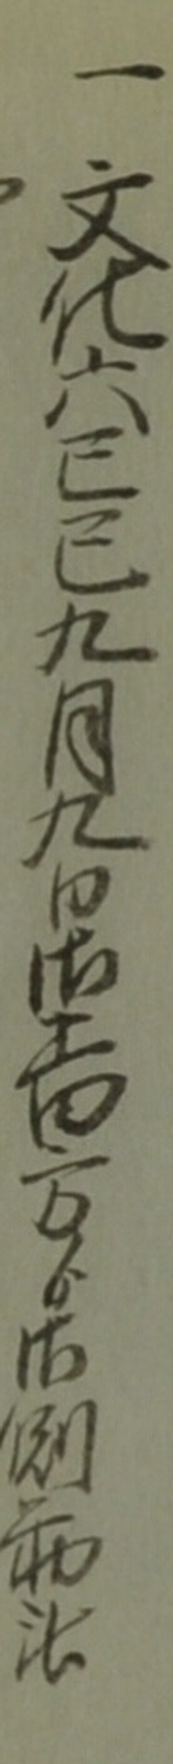一文化六己巳九月九日御番方ゟ御側勤被
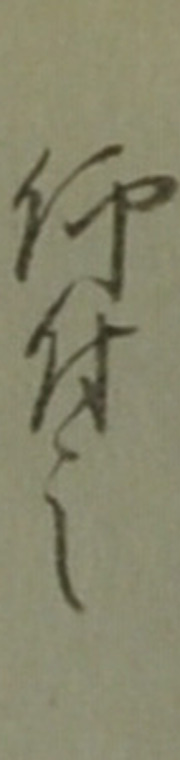仰付之
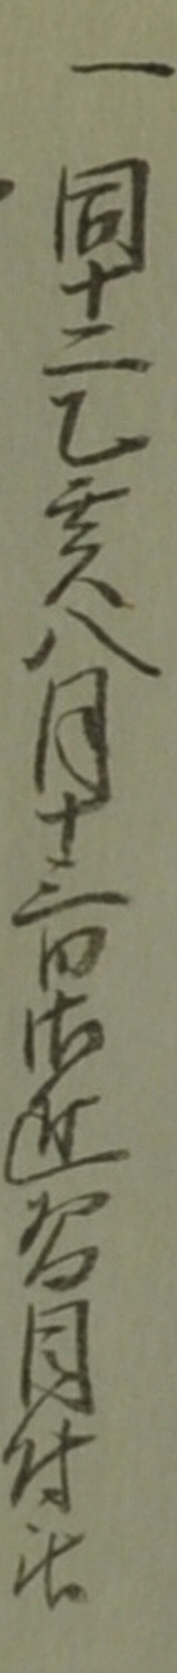一同十二乙亥八月十三日御近習目付被
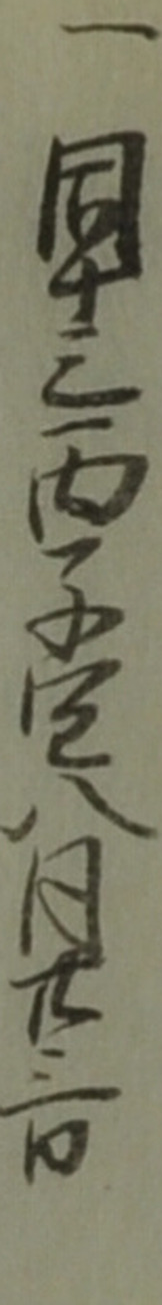一同十三丙子閏八月廿三日
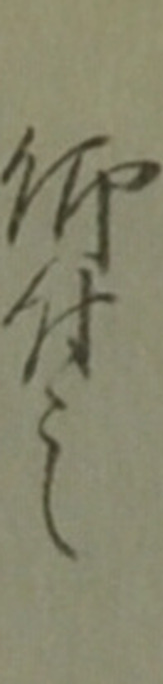仰付之
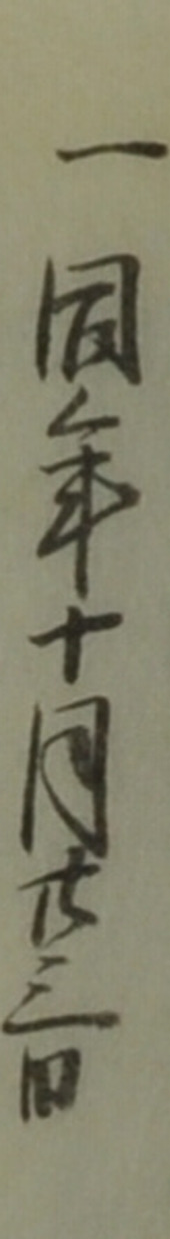一同年十月廿三日
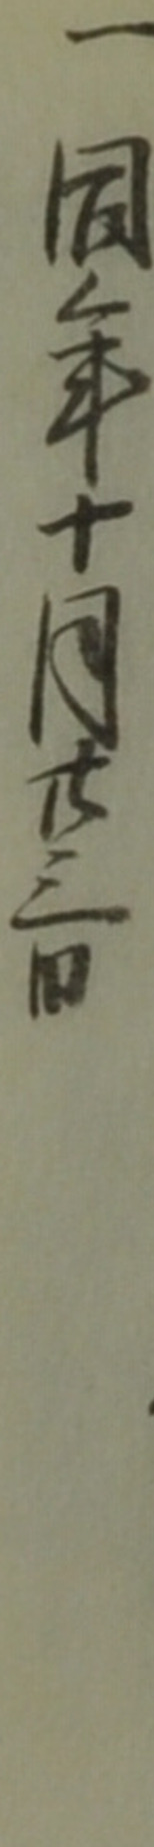一同年十月廿三日
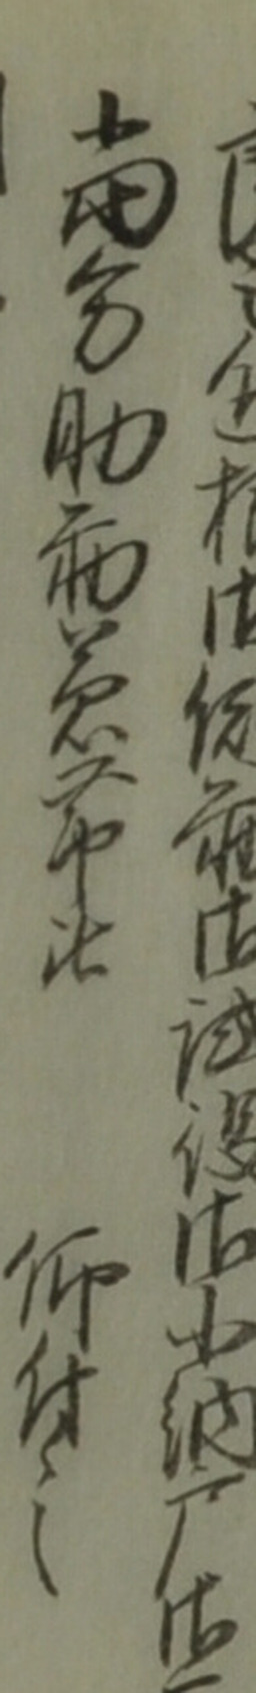当分助勤兼帯被仰付之
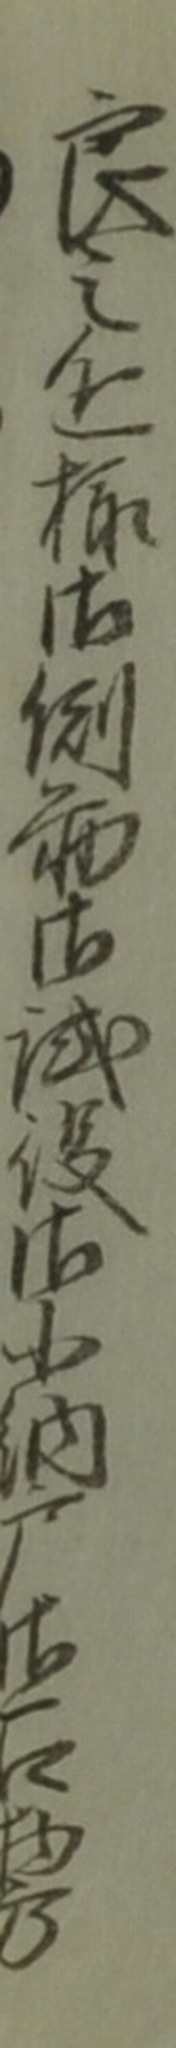良之進様御側御試役御小納戸御召物方
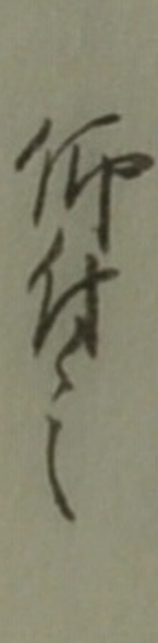仰付之
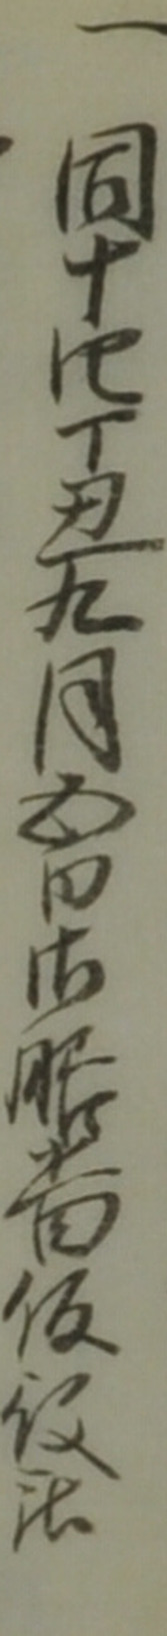一同十四日丁丑九月五日御膳番仮役被
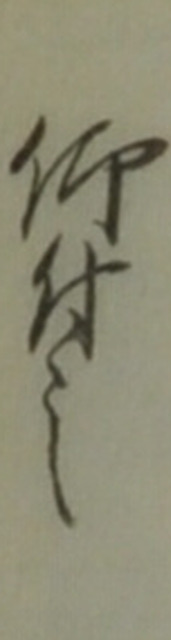仰付之
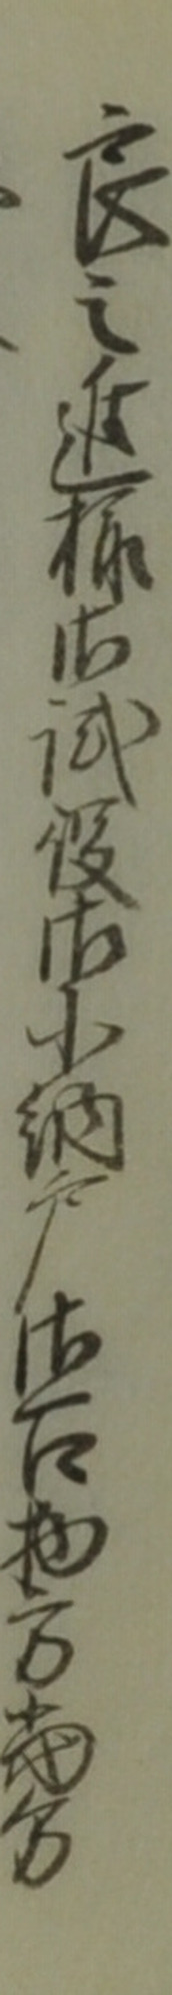良之進様御試役御小納戸御召物方当分
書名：諸御役代々録（五）
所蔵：伊那市立高遠町図書館・合同会社AMANE
